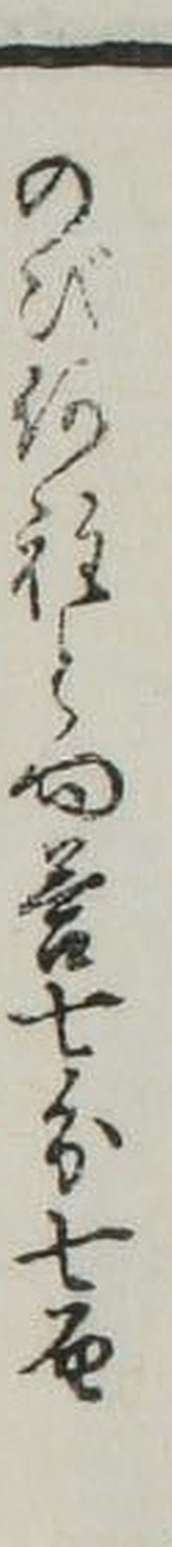のび何程と問答七分七厘
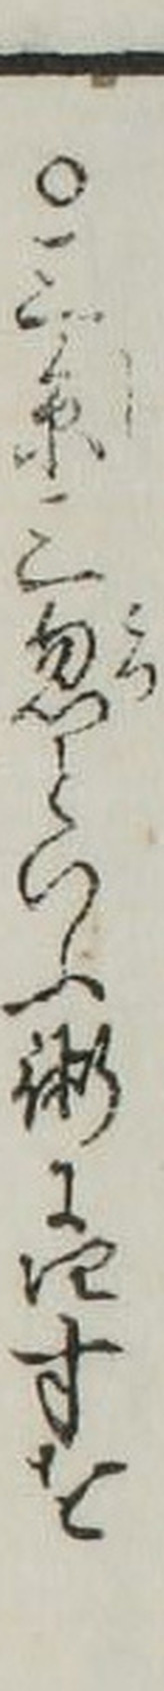〇三糸三忽といふ術に四寸を
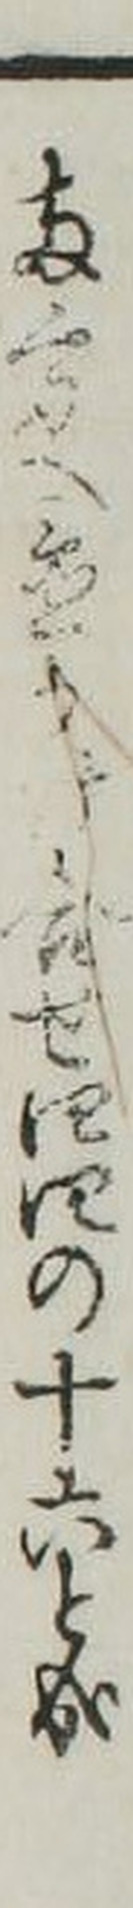両方へ置かけ合せ四四の十六と成
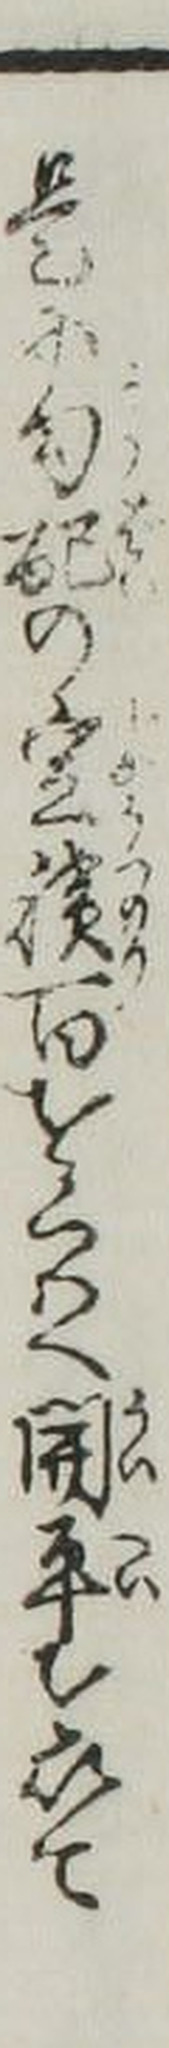是に勾配の定積百をくはへ開平を以て
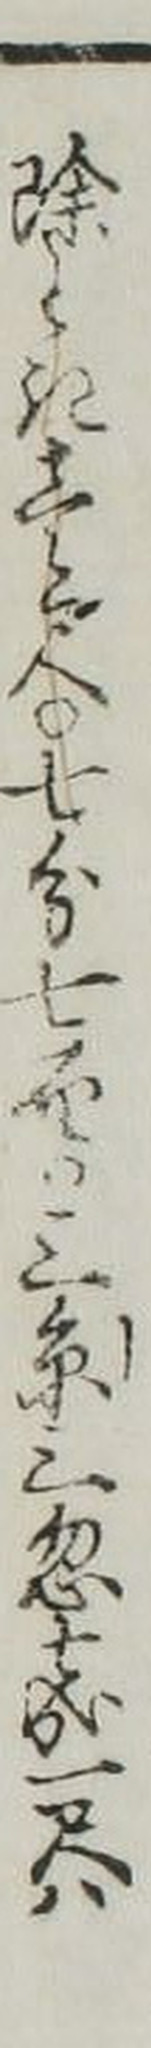除とき壱尺〇七分七厘〇三糸三忽七成一尺は
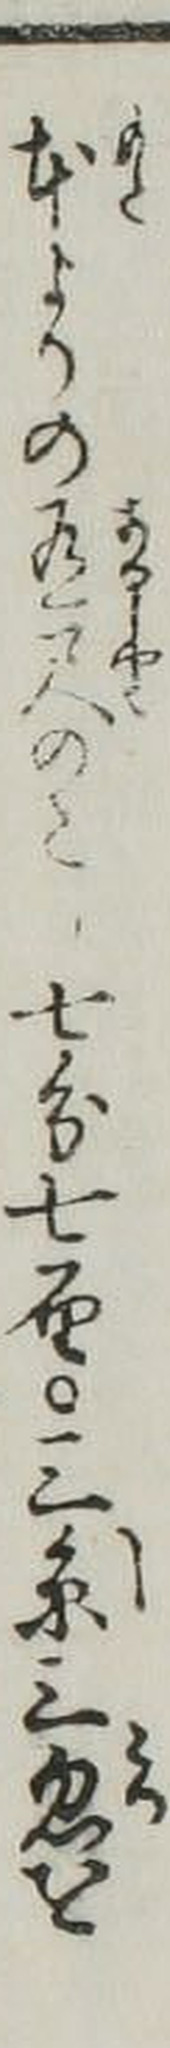本よりの有尺のこ七分七厘〇三糸三忽を
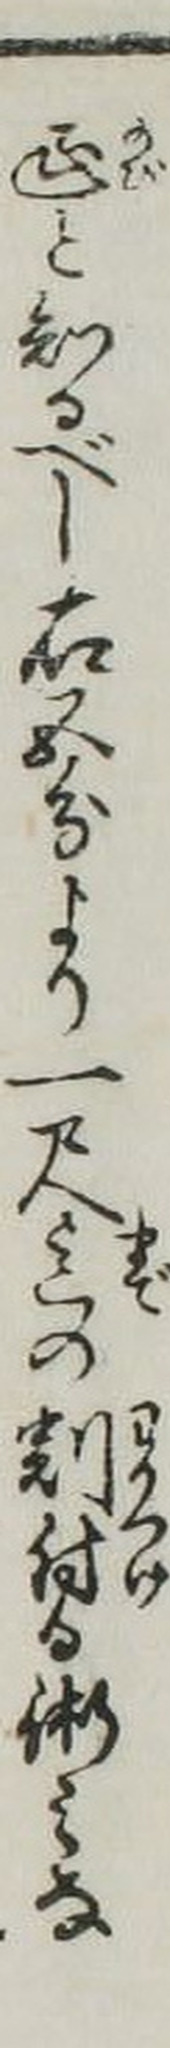延と知るべし右五分より一尺迄の割付る術みな
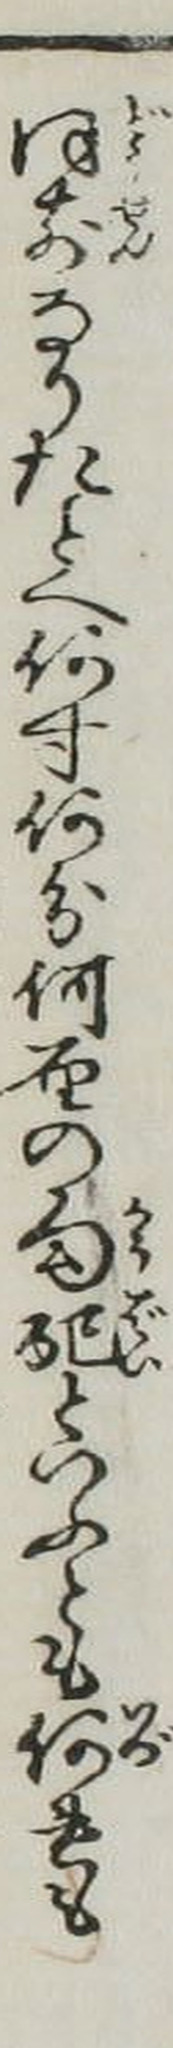同前なりたとへ何寸何分何厘の勾配といふとも何れも
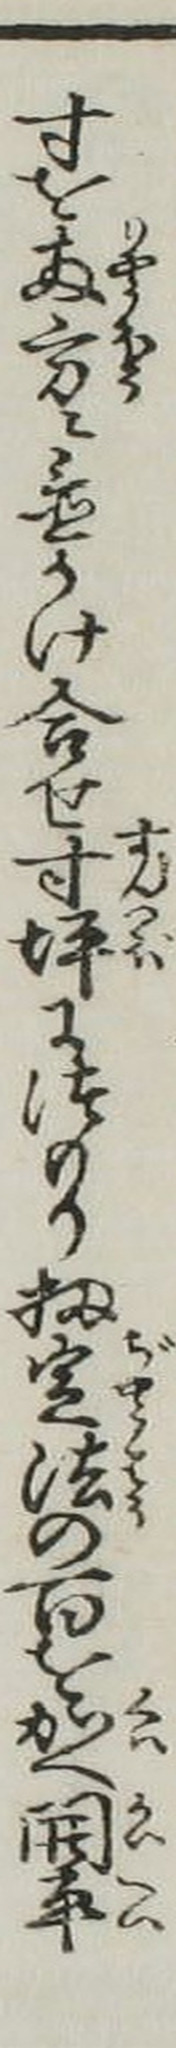寸を両方に置かけ合せ寸坪につもり扨定法の百を加へ開平
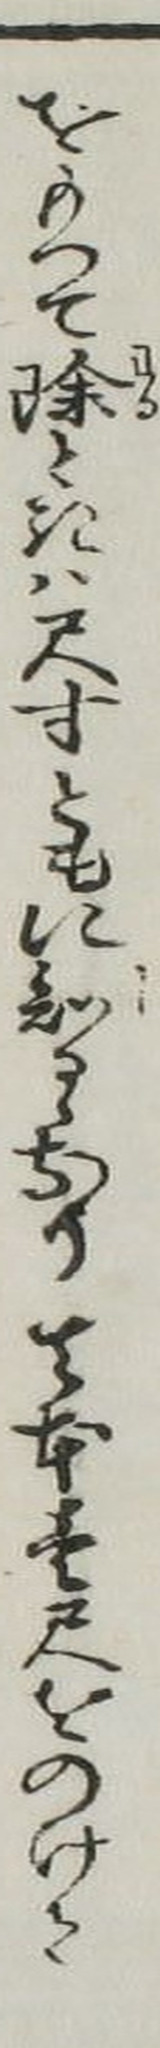をもつて除ときは尺寸ともに知るゝなり其本壱尺をのけて
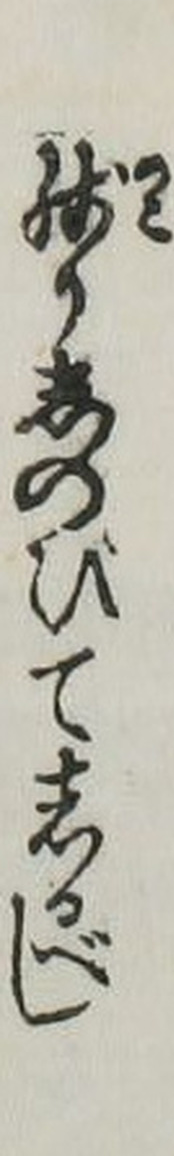残りしのびてしるべし
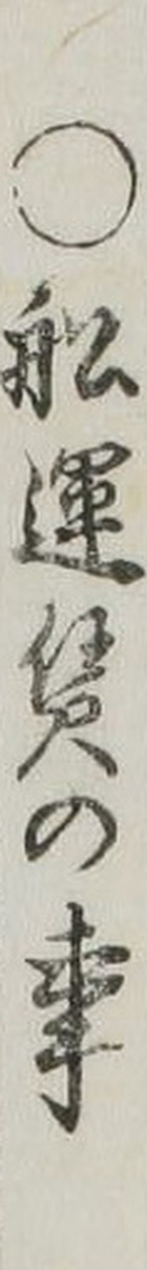○船運賃の事
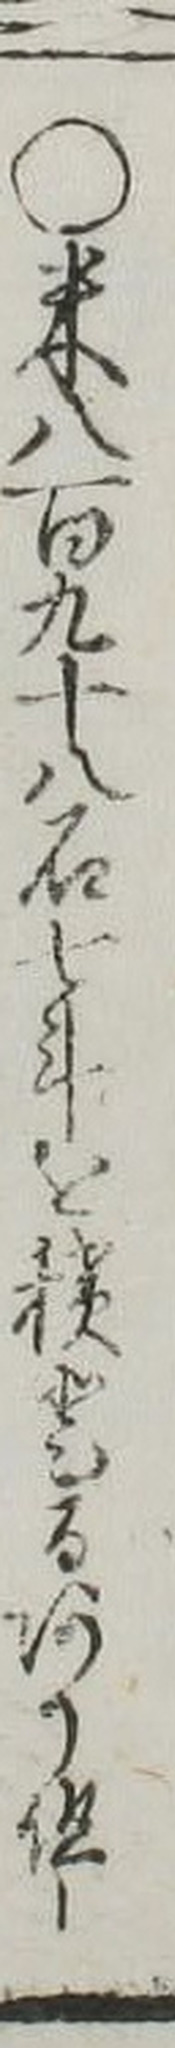○米八百九十八石七斗を積とるあり但し
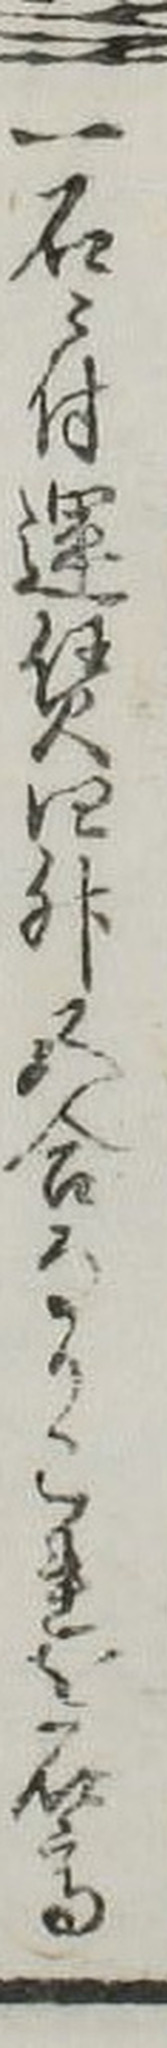一石に付運賃四升五合なりこれを石高
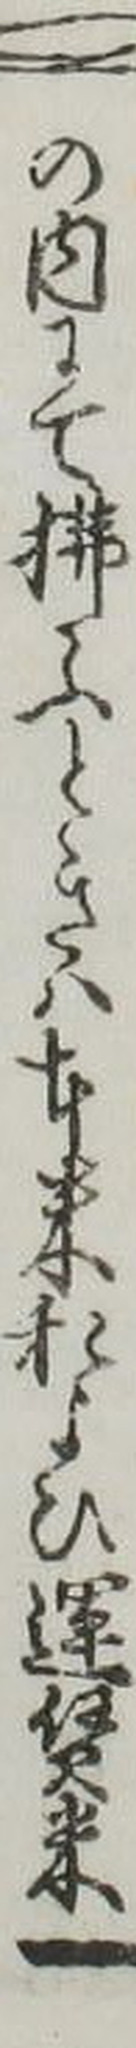の内にて払ふときは本米およひ運賃米
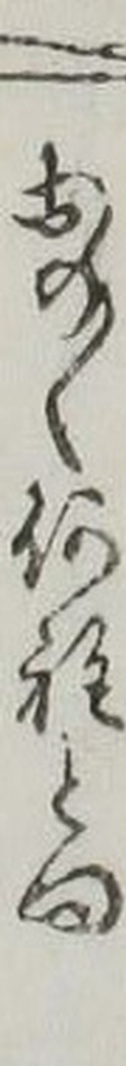おの〳〵何程と問
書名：宝玉塵劫記
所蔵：東京学芸大学教育コンテンツアーカイブ
